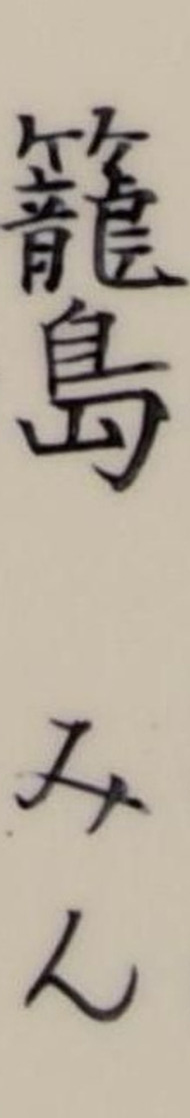籠島みん
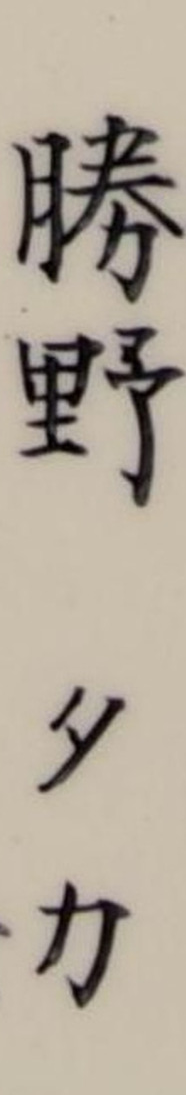勝野夕力
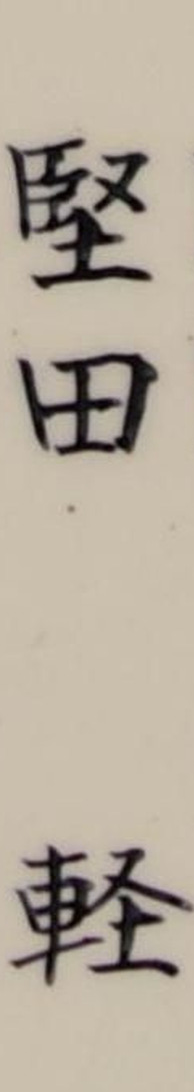堅田軽
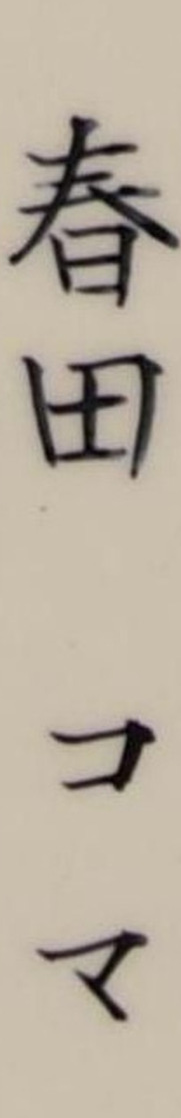春田コマ
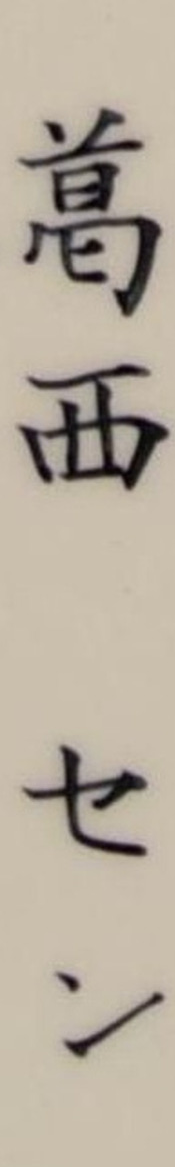葛西セン
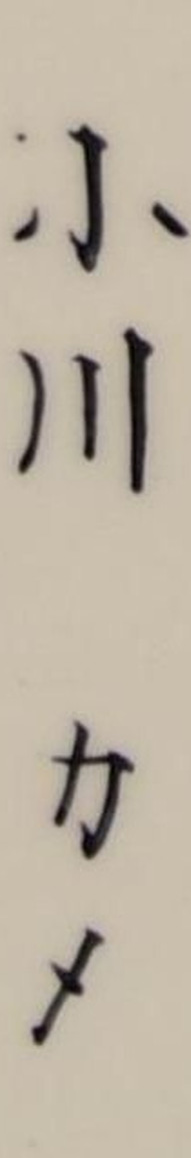小川カメ
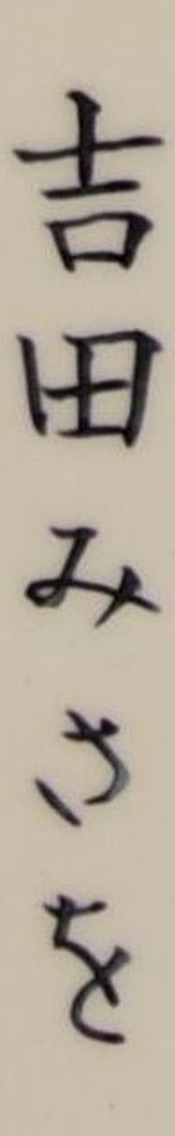吉田みさを
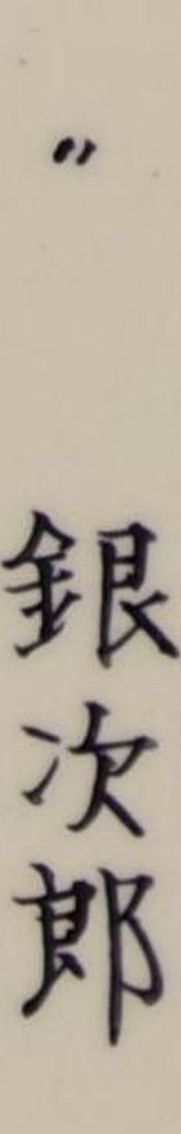銀次郎
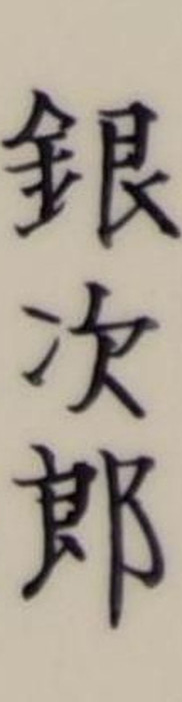銀次郎
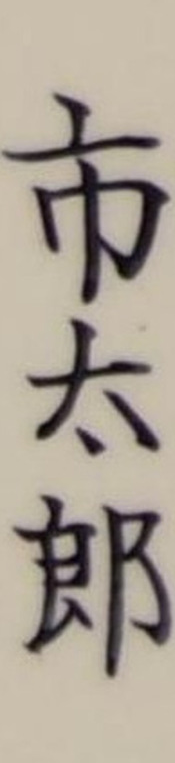市太郎
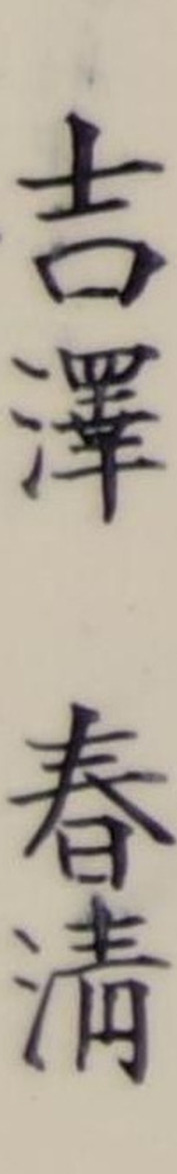吉澤春清

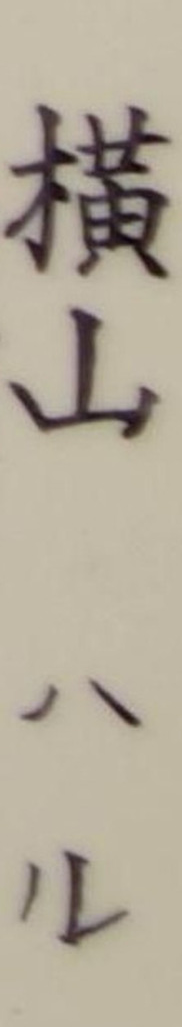横山ハル
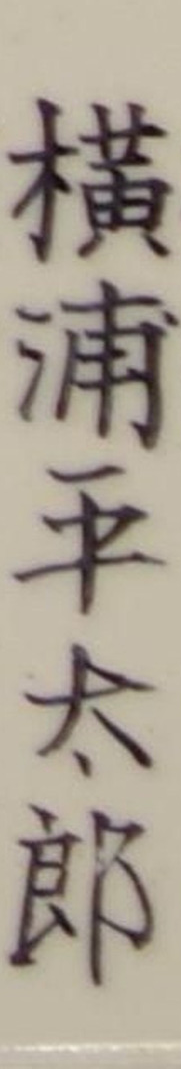横浦平太郎
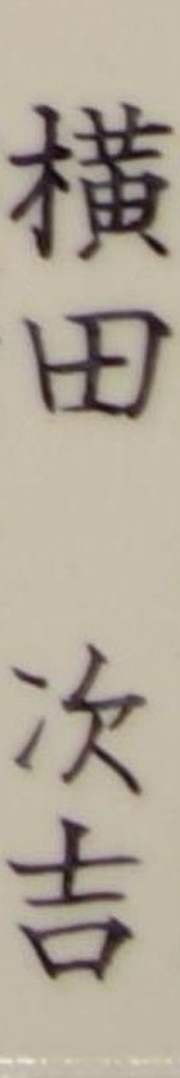横田次吉
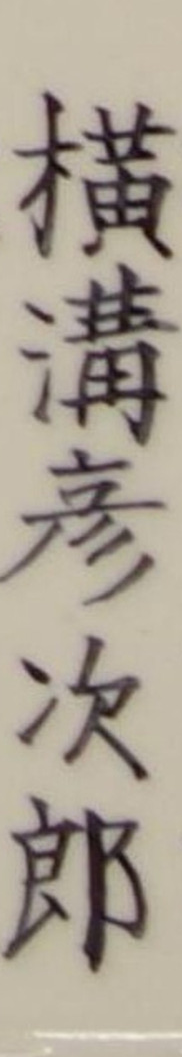横溝彦次郎
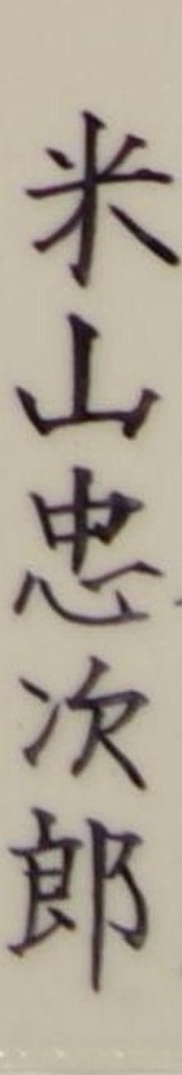米山忠次郎
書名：E~L
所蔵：高野山金剛峯寺
